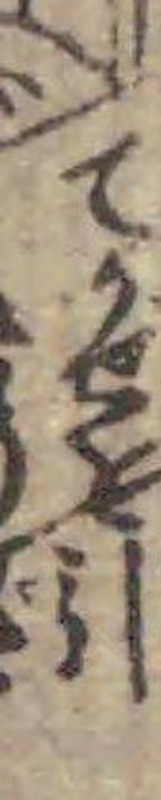てかぜを引
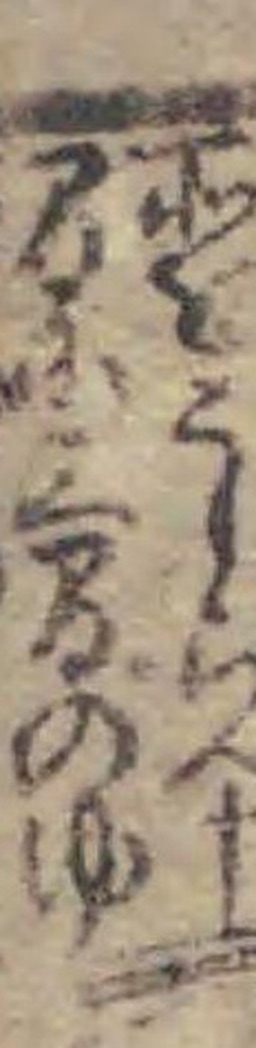間に三間のゆ
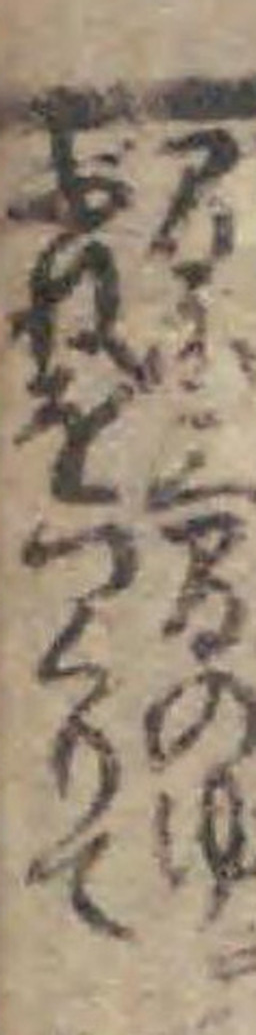ぶねをつくりて
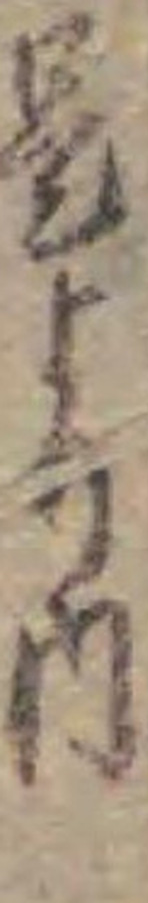是より内
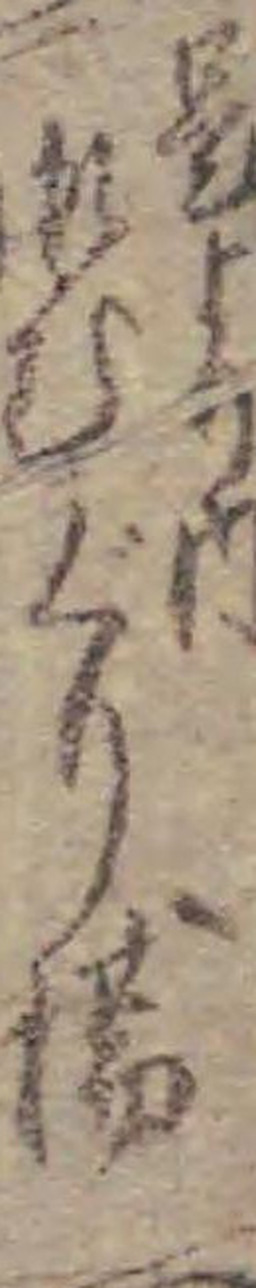御むぐり橋
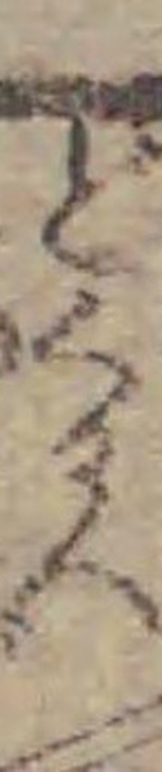どくる人
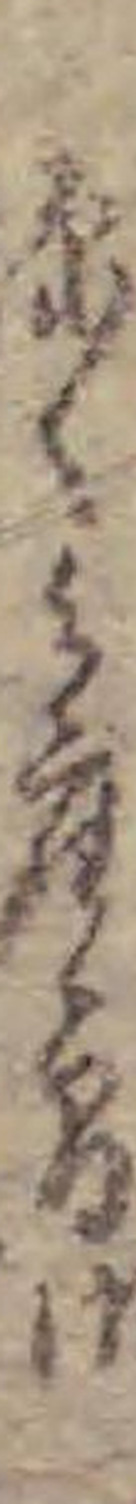深く御座候間御
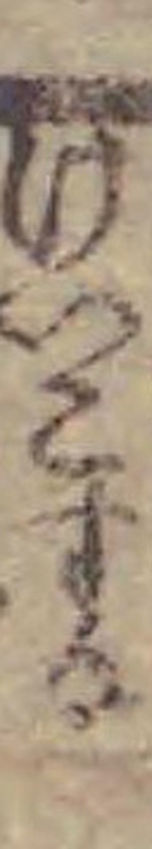けいこする
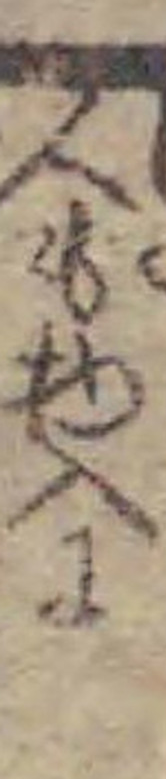人も物入に
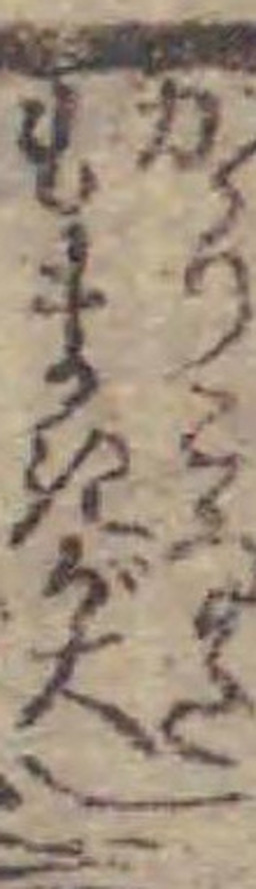もまきが大
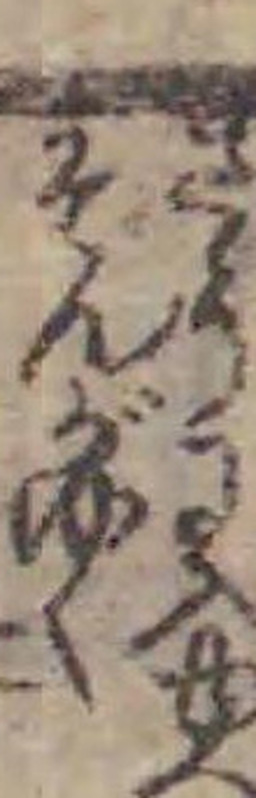そんがゆく
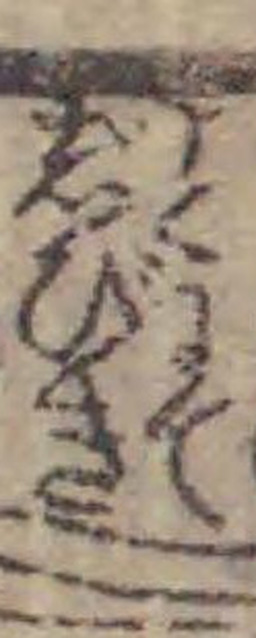じびき

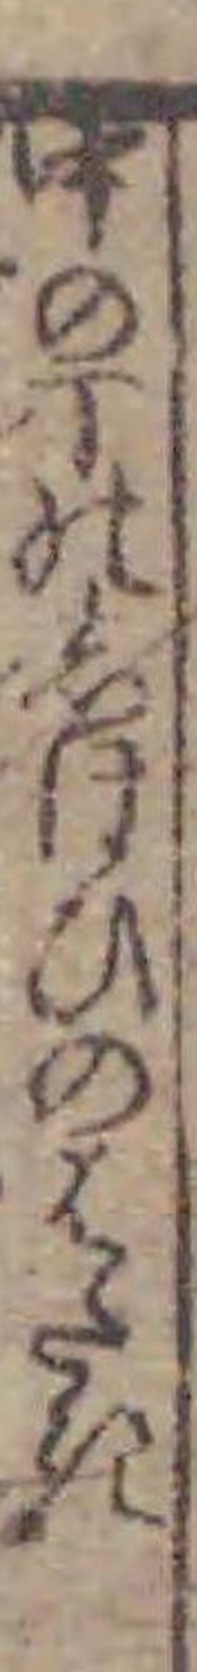中の丁のしほひのはたき
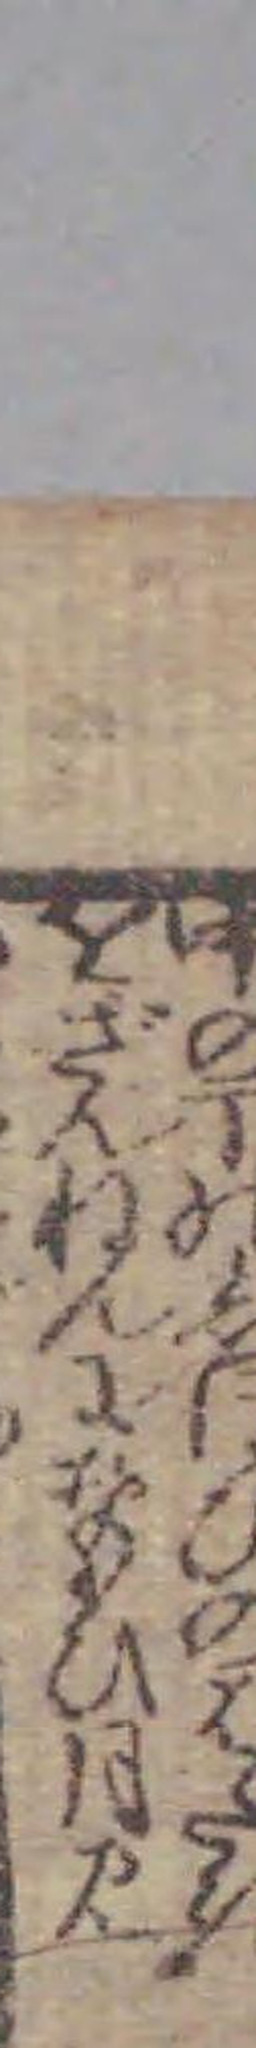をざんねんにおもひ月見
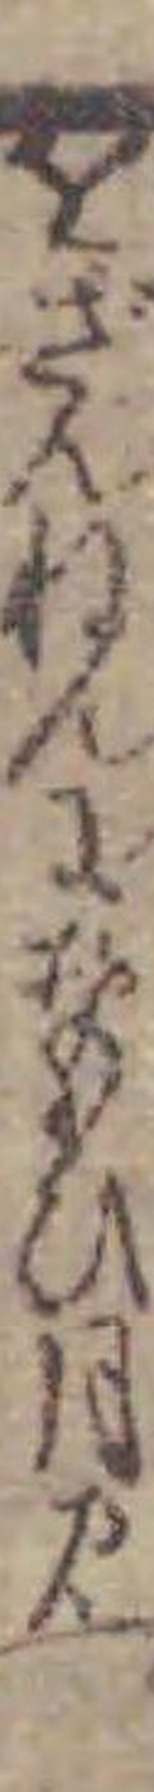をざんねんにおもひ月見
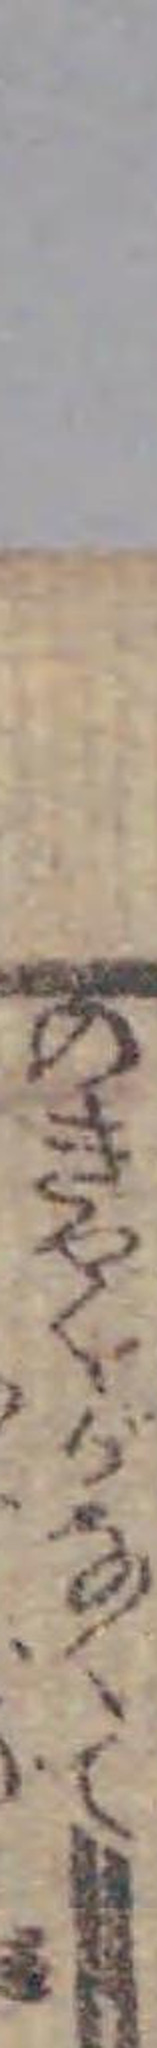のきやくがなくて
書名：本樹真猿浮気噺 : 3巻
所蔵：国立国会図書館 National Diet Library, JAPAN
